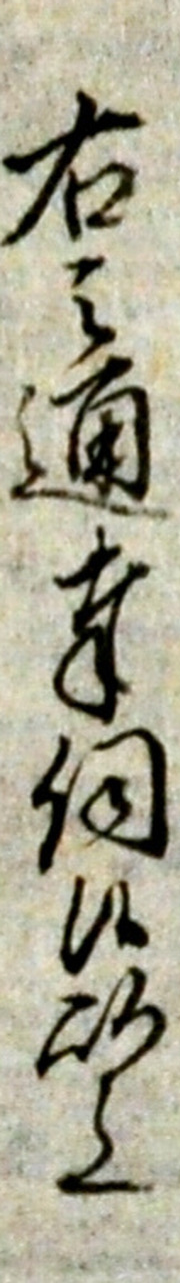右之通奉伺候以上
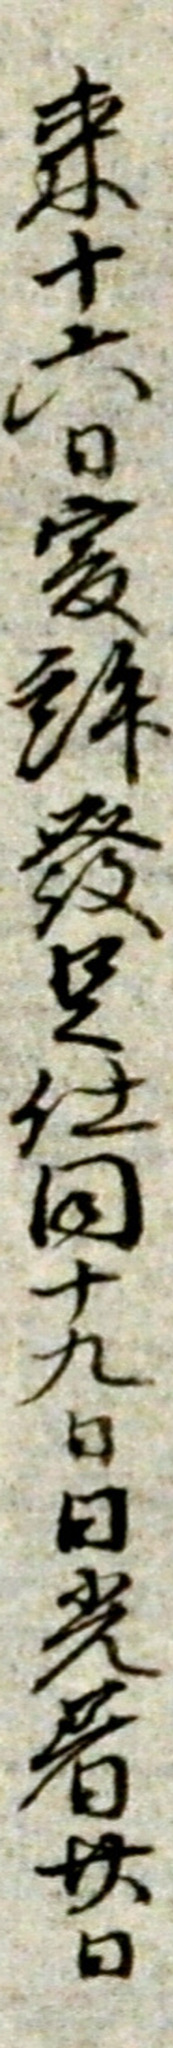來十六日爰許発足仕同十九日日光着廿日
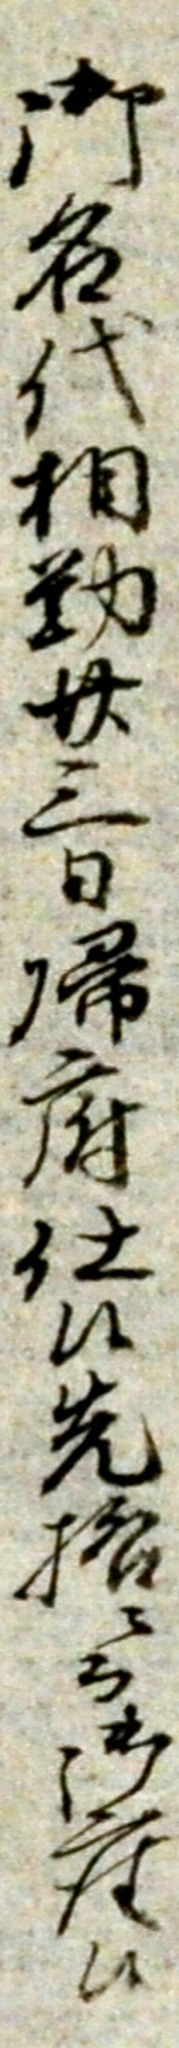御名代相勤廿三日帰府仕候先格二而御座候
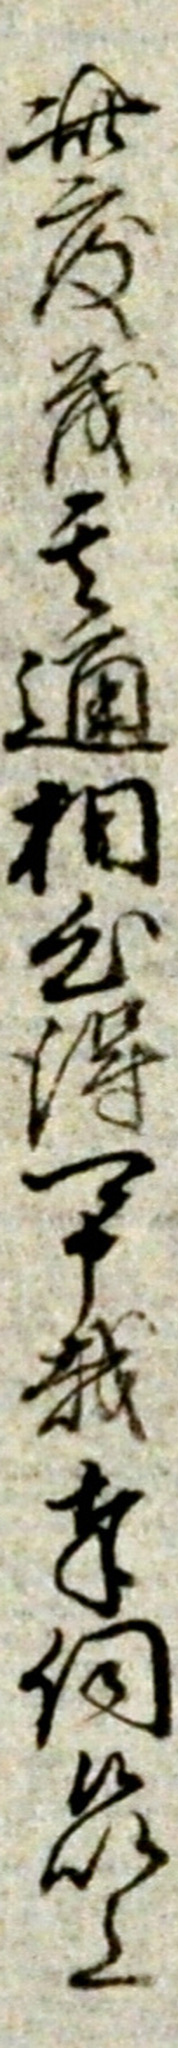此度も其通相心得可申哉奉伺候以上
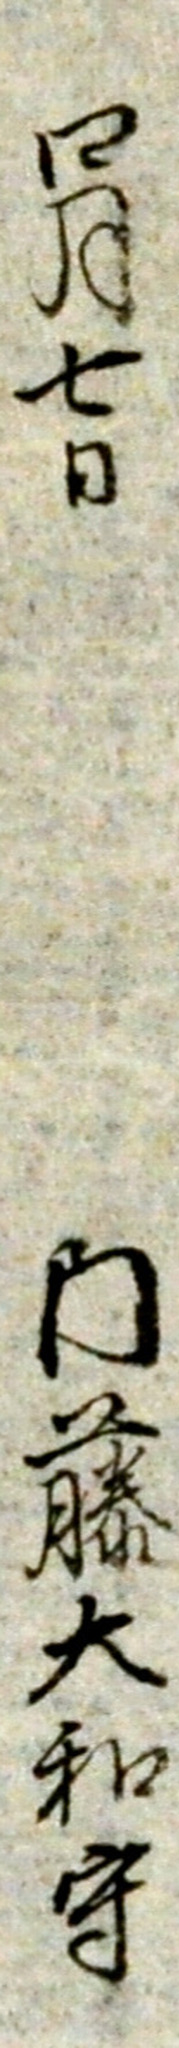四月七日内藤大和守
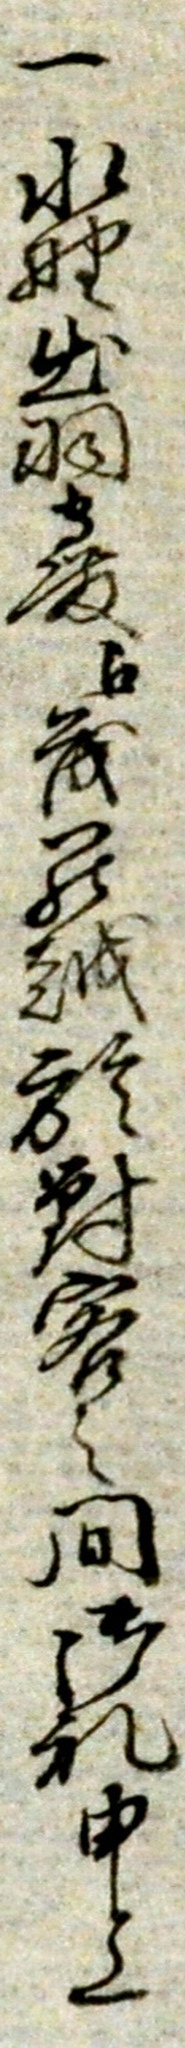一水野出羽守殿江も罷越於対客之間御礼申上
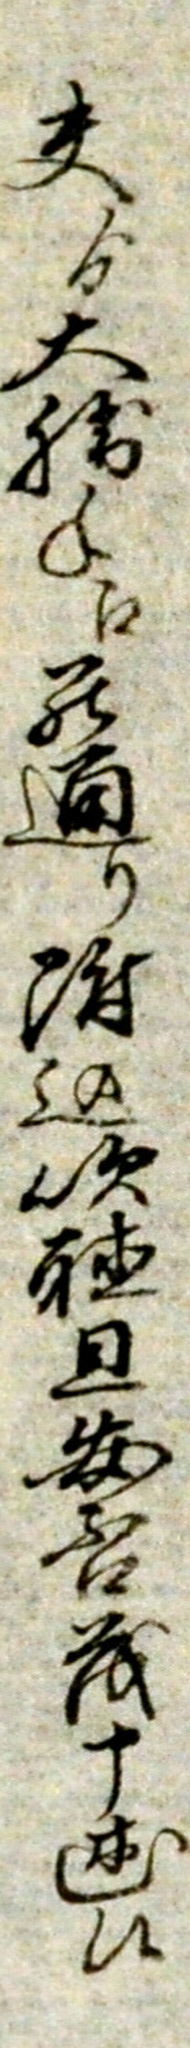夫ゟ大勝手江罷通り附込吹聴且安否も申述候
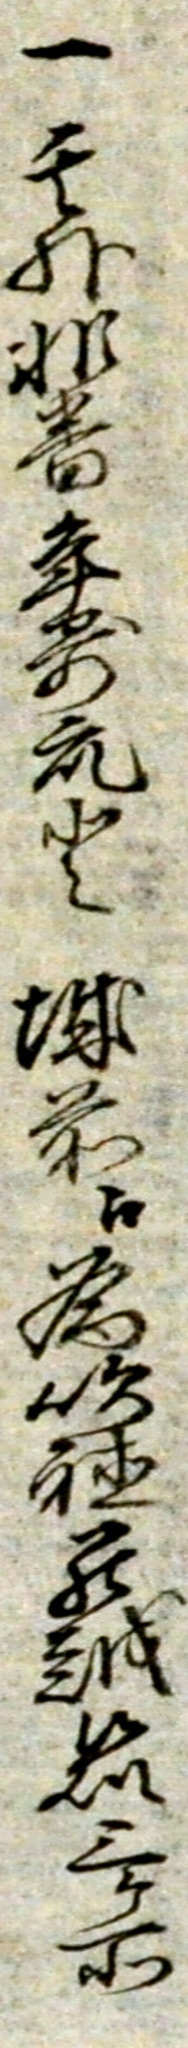一其外非番年寄衆登城前江為吹聴罷越候処三ヶ所
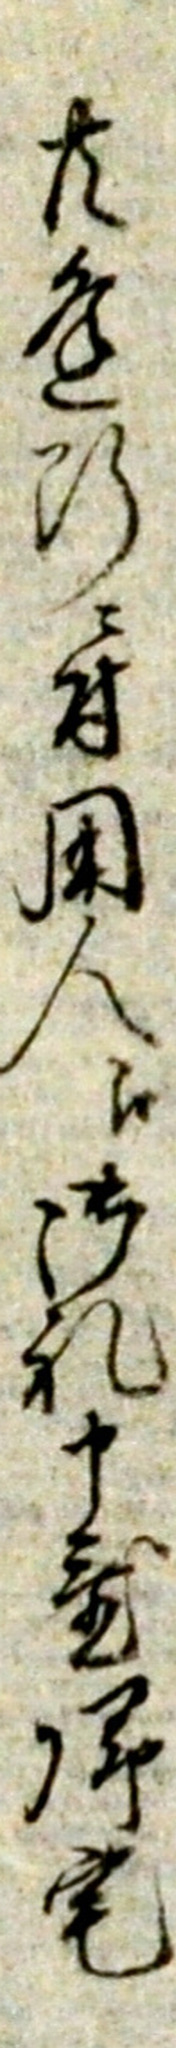共逢断二付用人江御礼申置帰宅
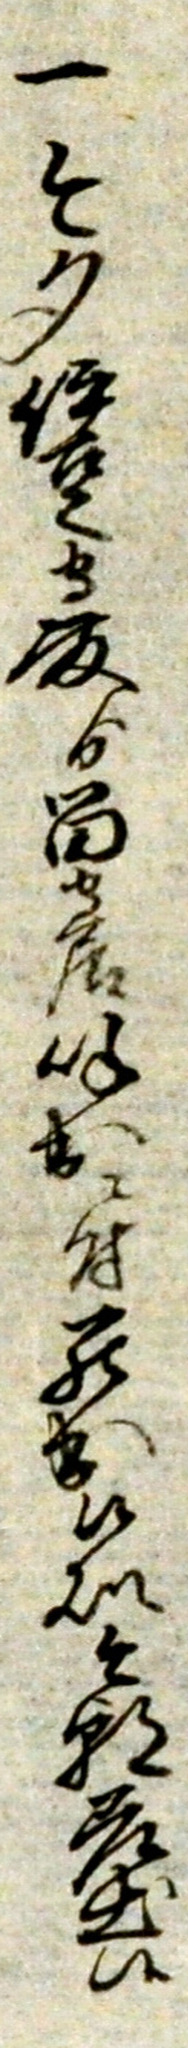一今夕伊豆守殿ゟ留守居呼出二付罷出候処今朝差出候
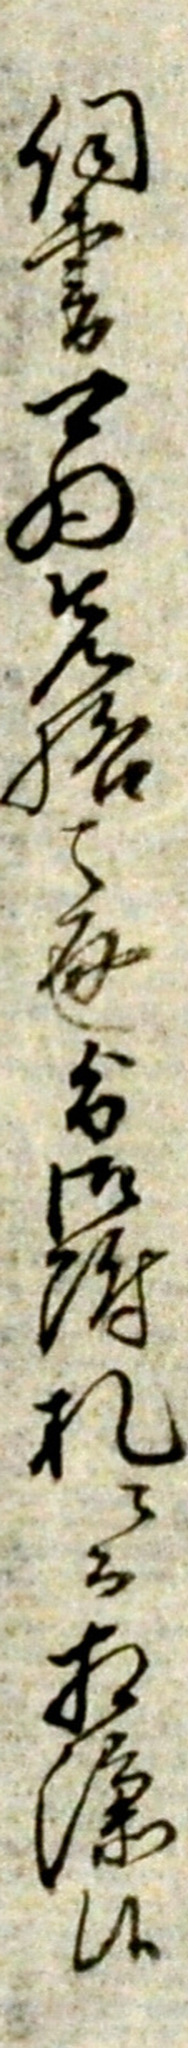伺書可為先格之通旨御附札二而相済候
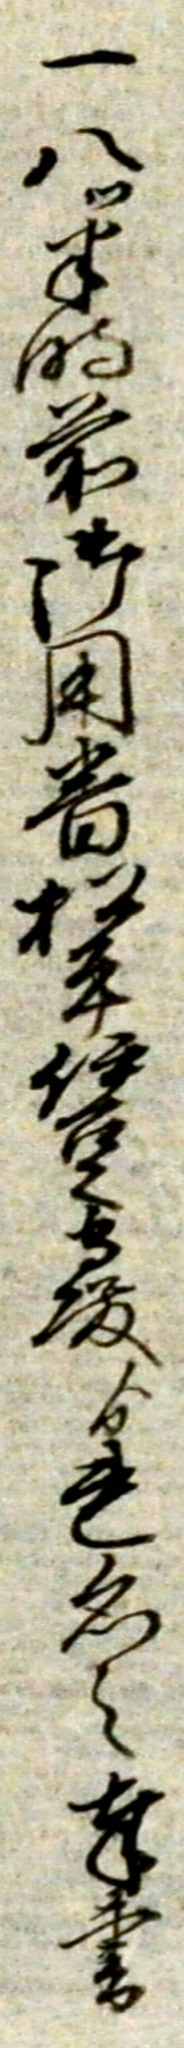一八ツ半時前御用番松平伊豆守殿ゟ連名之奉書
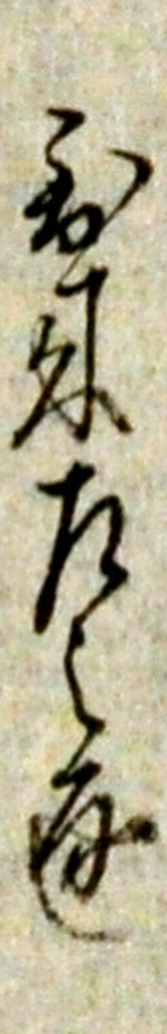到来左之通
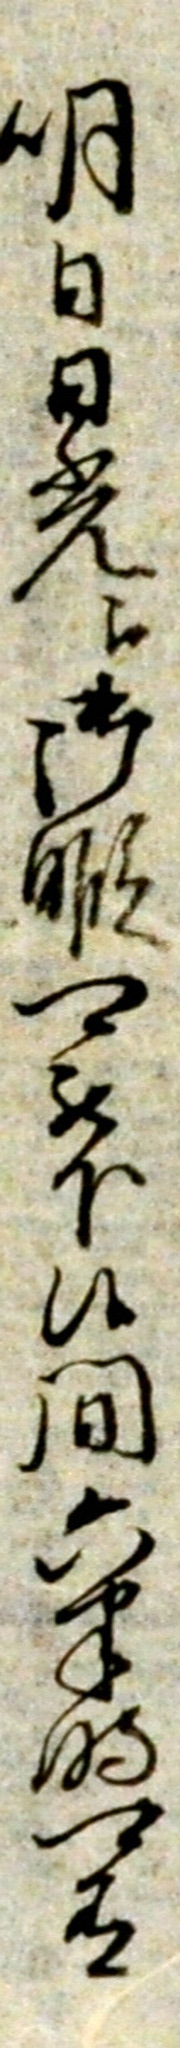明日日光江御暇可被下候間六半時可有
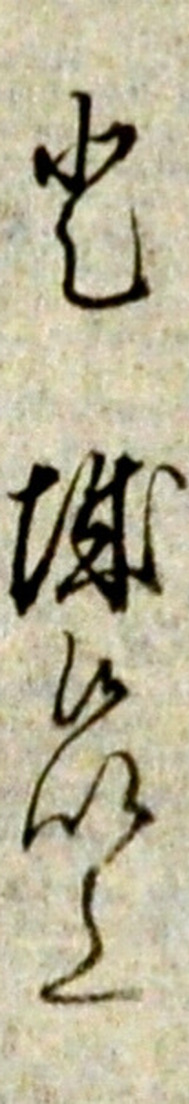登城候以上
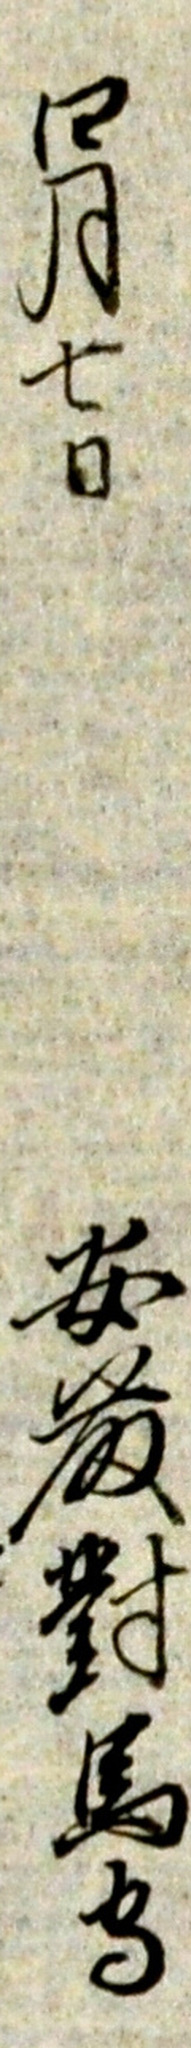四月七日安藤対馬守
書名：日光御名代相勤候節ノ留
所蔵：伊那市立高遠町図書館・合同会社AMANE
